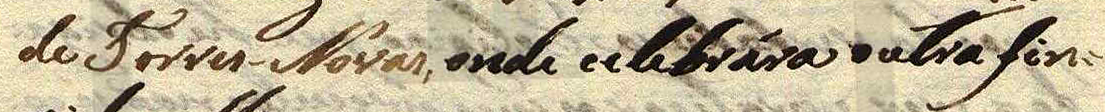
de Torres-Novas, onde celebrára outra fin
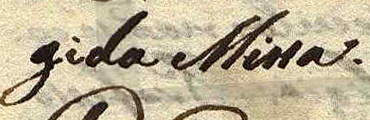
gida Missa.
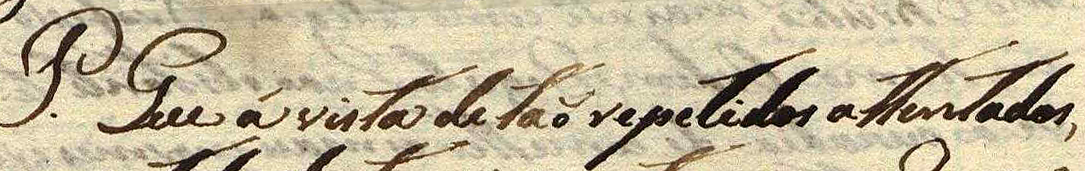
P. Que á vista de taõ repetidos attentados,
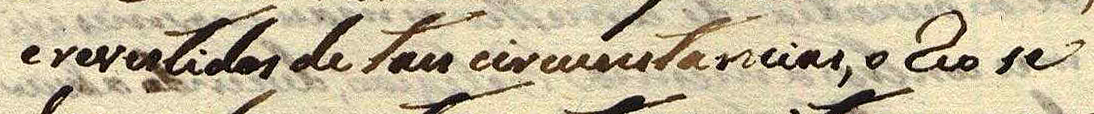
e revestidos de taes circunstancias, o Reo se
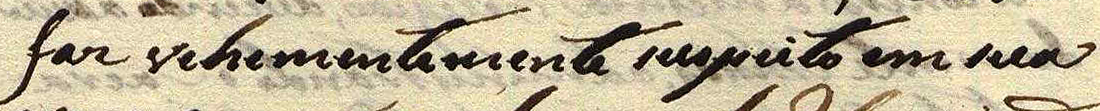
faz vehementemente suspeito em sua
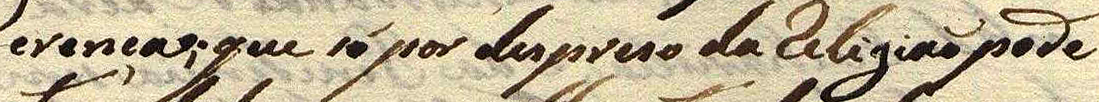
crença; que só por despreso da Religiaõ pode
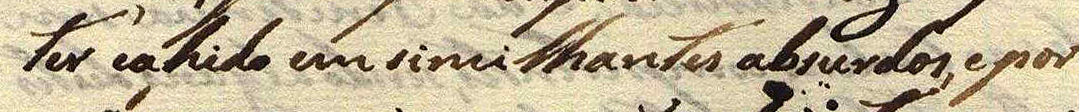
ter cahido em similhantes absurdos, e por
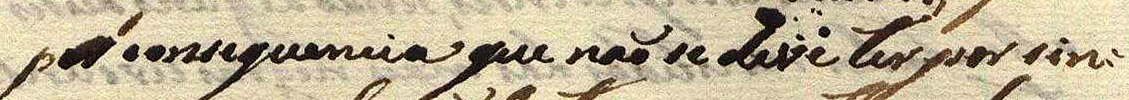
por consequencia que naõ se deve ter por sin
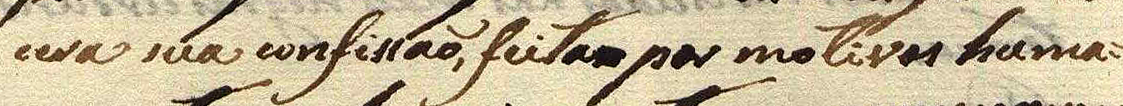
cera sua confissaõ, feitas por motivos huma
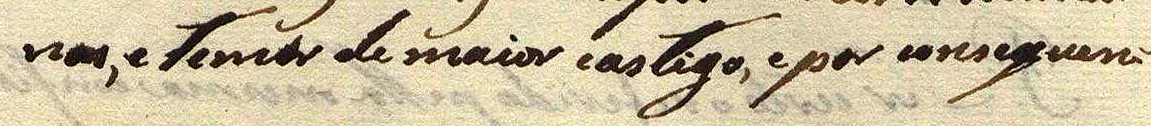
nos, e temor de maior castigo, e por consequen
